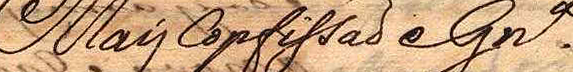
Mais Confissaõ e Gn.a
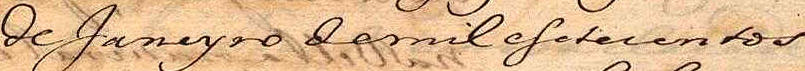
de Janeyro de mil e setecentos
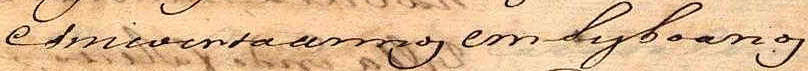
e sincoenta annos em Lisboa nos
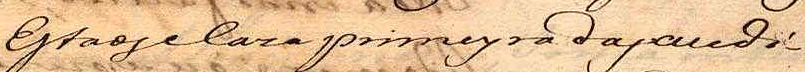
Estaos e Caza primeyra das audi
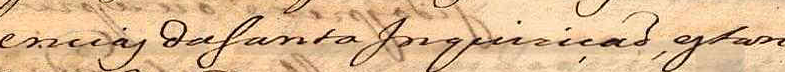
encias da santa Jnquiziçaõ, estan
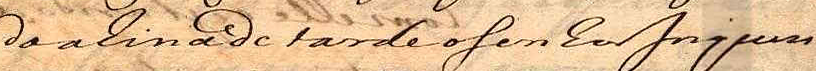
do ahi na de tarde o senhor Jnquizi
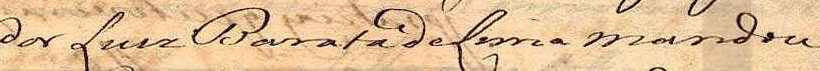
dor Luiz Barata de Lima mandou
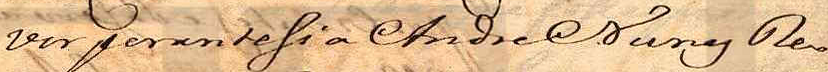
vir perante si a Andre Nunes Re
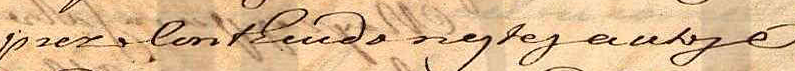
prezo e Contheudo nestes autos e
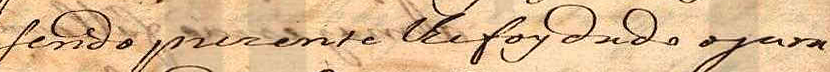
sendo prezente lhe foy dado o jura
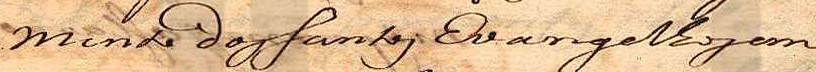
mento dos santos Evangelhos em
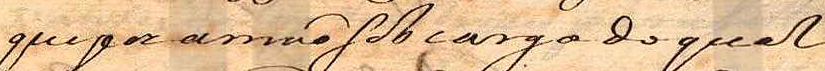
que poz a maõ sob cargo do qual
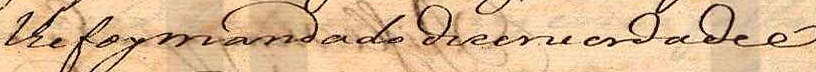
lhe foy mandado dizer uerdade
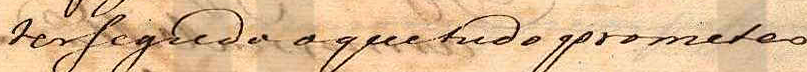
ter segredo o que tudo prometeo
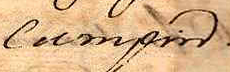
Cumprir.
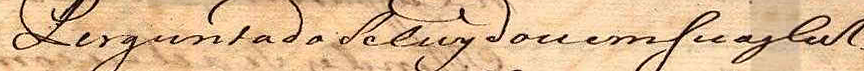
Perguntado se Cuydou em suas Cul
